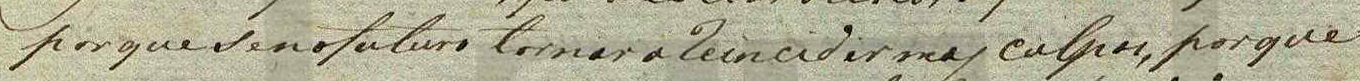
porque se no futuro tornar a Reincidir mas culpas, porque
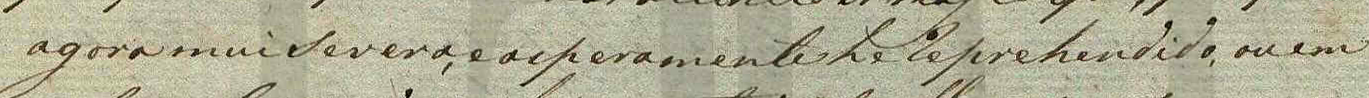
agora mui severa, e asperamente he Reprehendido, ou em
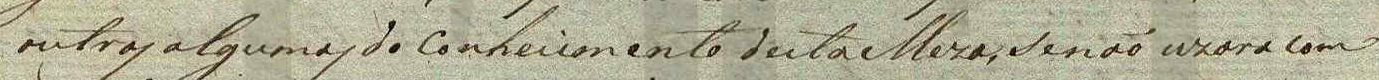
outras algumas do conhecimento desta Meza, senaõ uzara com
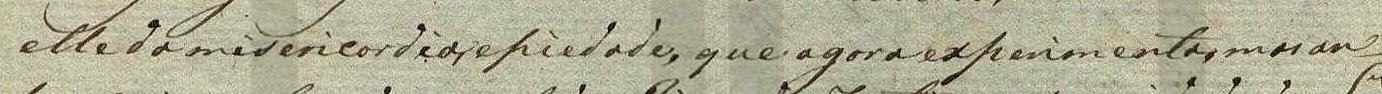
elle da misericordia, e piedade, que agora experimenta, mas an
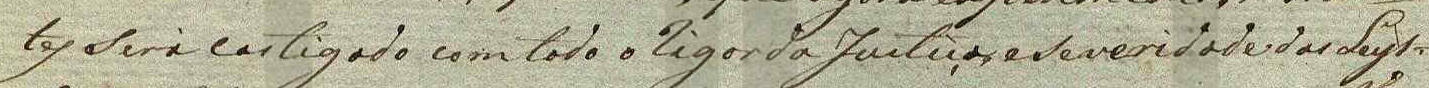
tes será castigado com todo o Rigor da Justiça, e severidade das Leys
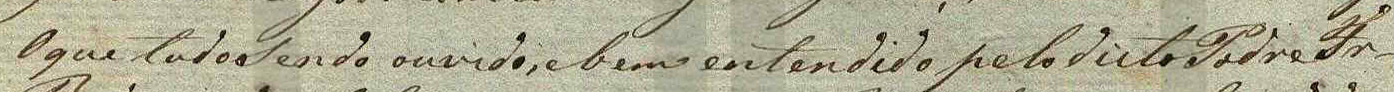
O que tudo sendo ouvido, e bem entendido pelo dicto Padre Fr
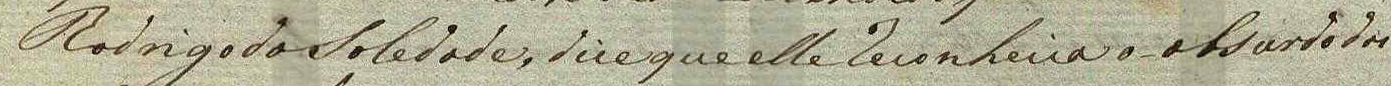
Rodrigo da Soledade, dice que elle Reconhecia o absurdo das
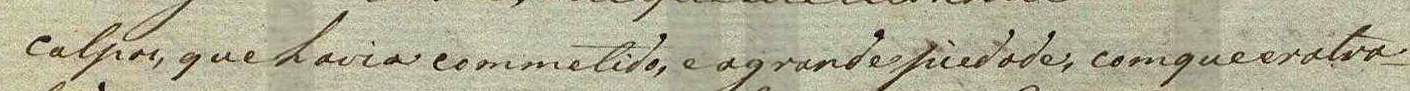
culpas, que havia commetido, e a grande piedade, com que era tra
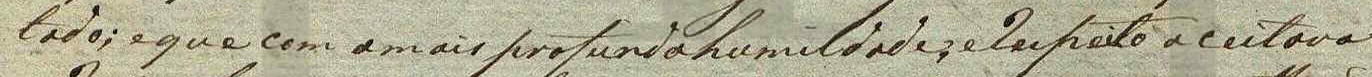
tado; e que com o mais profunda humildade, e Respeito aceitava
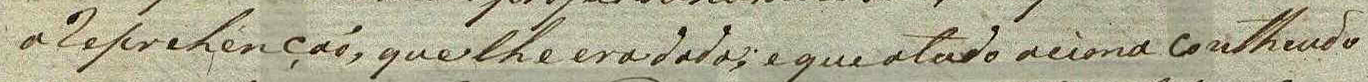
a Reprehençaõ, que lhe era dada; e que a tudo acima contheudo
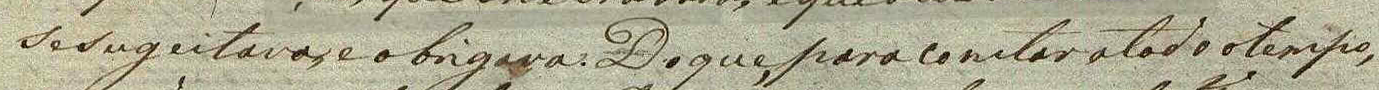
se sugeitava, e obrigava. Do que, para constar a todo o tempo,
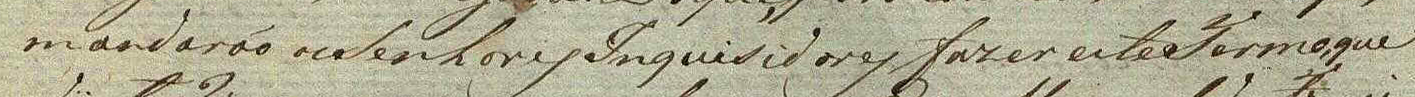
mandaraõ os Senhores Inquisidores fazer este Termo, que
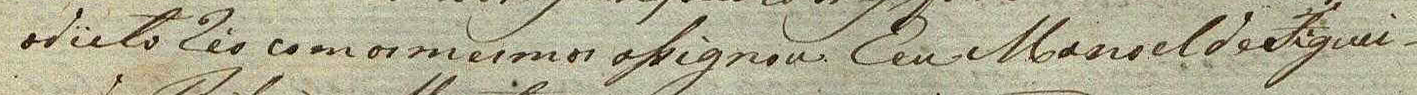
o dicto Reo com os mesmos assignou E eu Manoel de Figuei
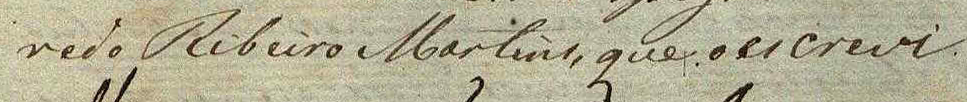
redo Ribeiro Martins, que o escrevi.
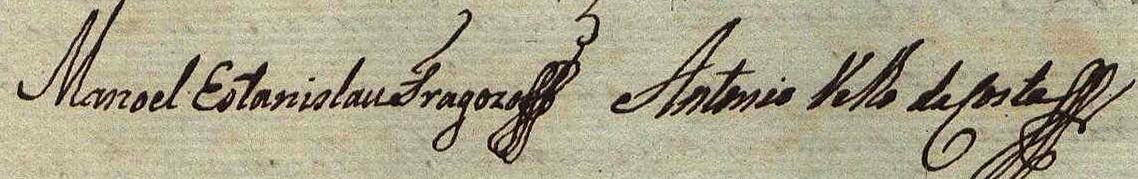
Manoel Estanislau Fragozo Antonio Velho da Costa
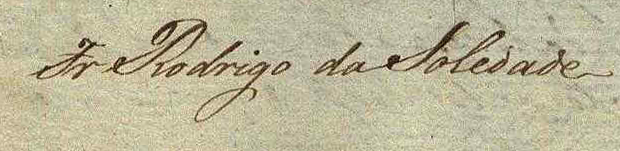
Fr Rodrigo da Soledade
